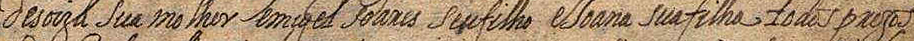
de soiza sua molher e migel soares seu filho e Ioana sua filha todos prezos
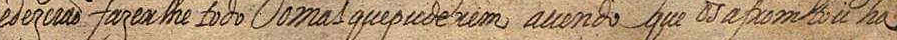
e dezeião fazer lhe todo o mal que puderem auendo que os afromtou ha
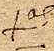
tas
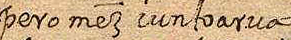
pero mēz iunto a rua
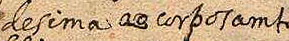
de sima ao corpo samto
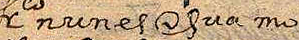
frco nunes e sua mo
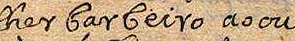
lher barbeiro ao ou
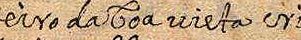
teiro da boa uista cris
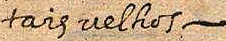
tais uelhos ~
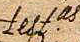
test.as
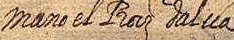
manoel Roiz̄ dalua
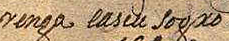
renga e a seu sogro
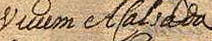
Viuem A Calsada
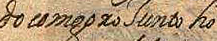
do comgoro Iunto ho
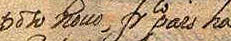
poso nouo, frco pais ha
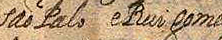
saõ Palo e Rui gomes
